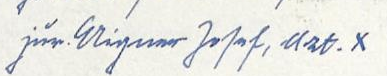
iur. Aigner Josef dzt. X
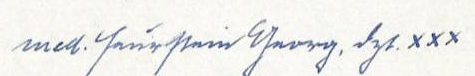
med. Feuerstein Georg, dzt XXX
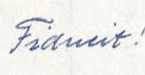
Fiducit!
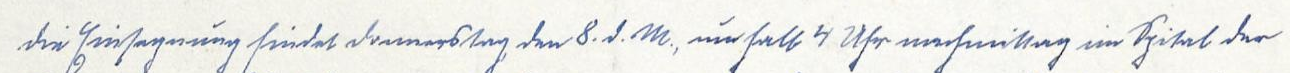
Die Einsegnung findet Donnerstag den 8 d. M., um halb 4 Uhr nachmittag im Spital der
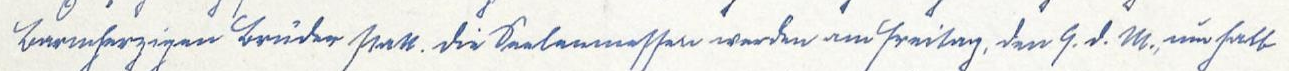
Barmherzigen Brüder statt. Die Seelenmessen werden am Freitag den 9. d. M., um halb
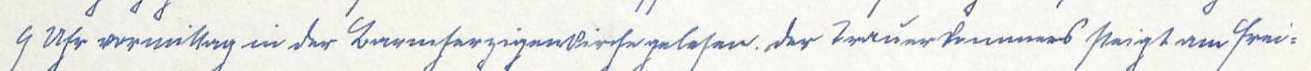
9 Uhr vormittag in der Barmherzigenkirche gelesen. Der Trauerkommers steigt am Frei-
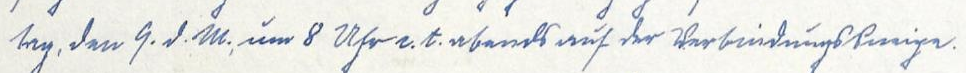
tag, den 9. d. M. um 8 Uhr c. t .ebenfalls auf der Verbindungskneipe.
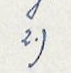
2)
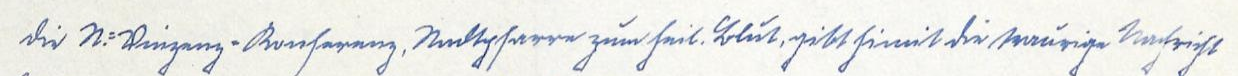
Die St. Vinzenz-Konferenz, Stadtpfarre zum heil. Blut, gibt hiermit die traurige Nachricht
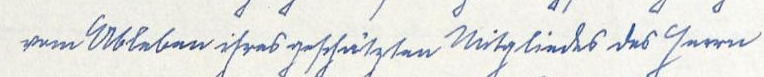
vom Ableben ihres geschätzten Mitglieds des Herrn
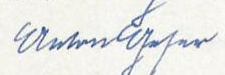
Anton Geser
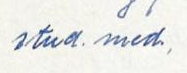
stud. med.
